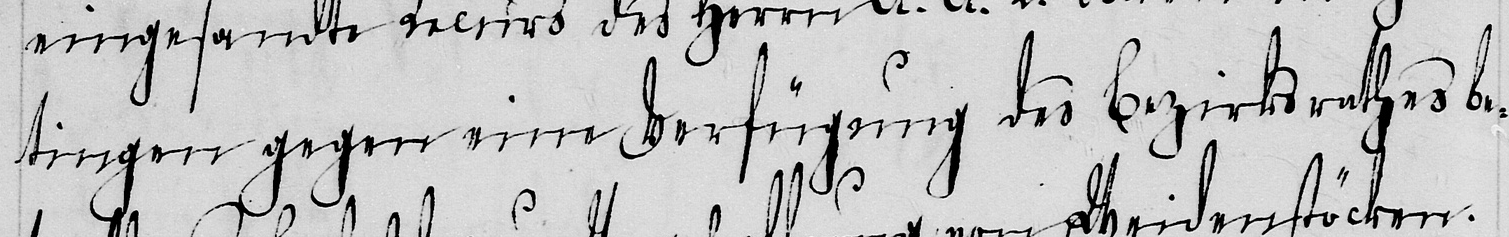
tingen gegen eine Verfügung des Bezirksrathes b¬
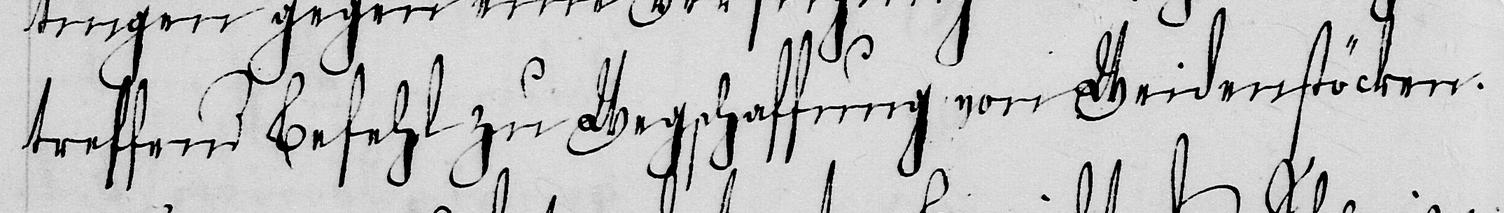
etreffend Befehl zu Wegschaffung von Weidenstöcken.
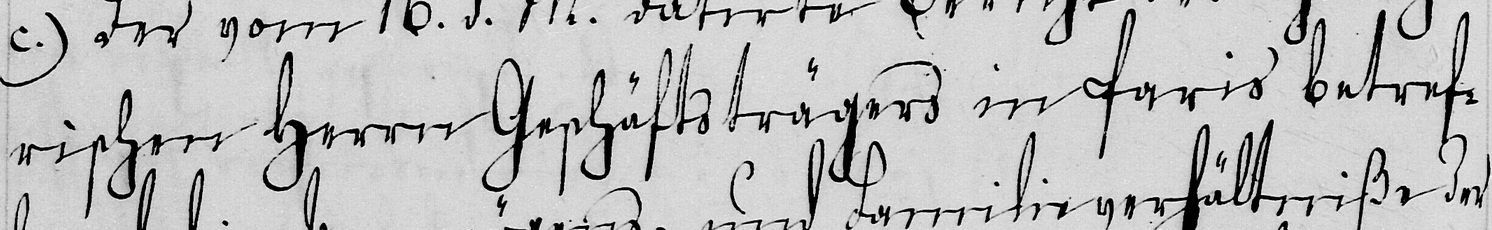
rischen Herrn Geschäftsträgers in Paris betref¬
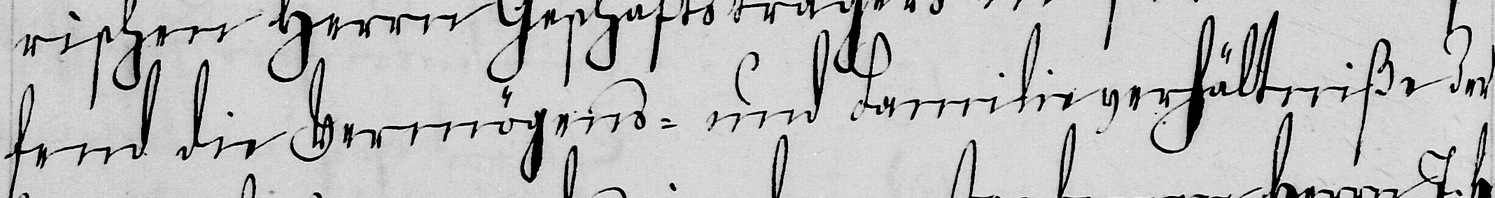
fend die Vermögens- und Familieverhältniße der
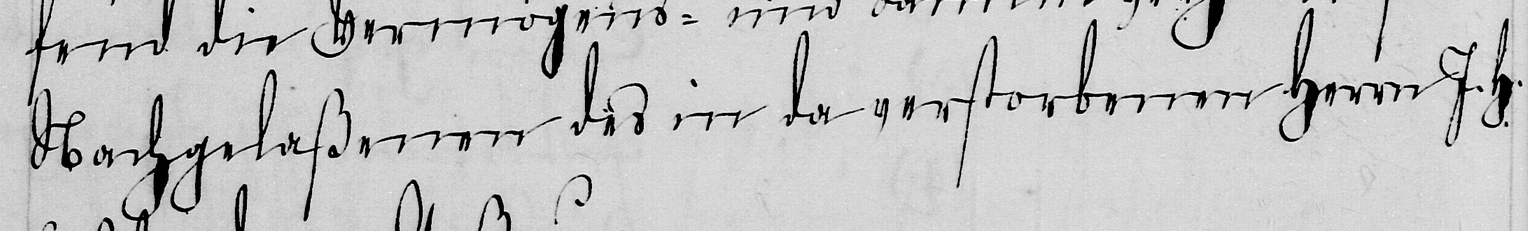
Nachgelaßenen des in da verstorbenen J.
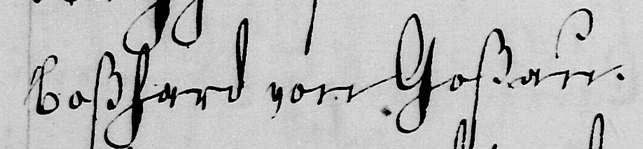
Boßhard von Goßau.
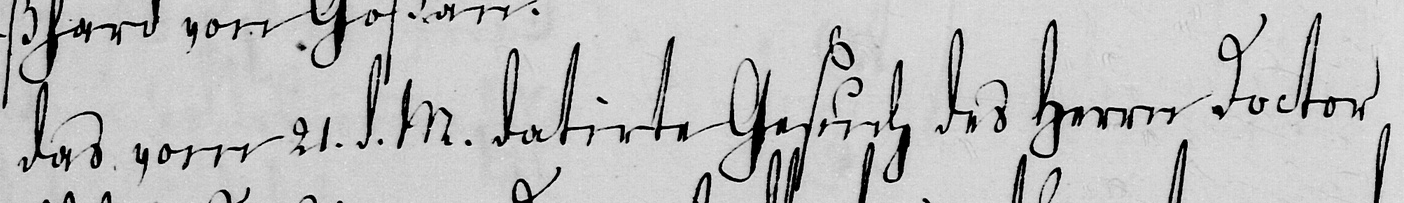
das vom 21. d. M. datirte Gesuch des Herrn Doctor
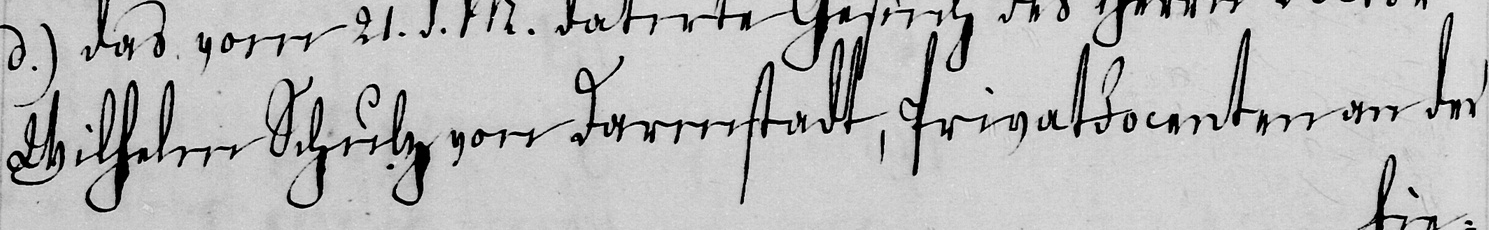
Wilhelm Schulz von Darmstadt, Privatdocenten an der
